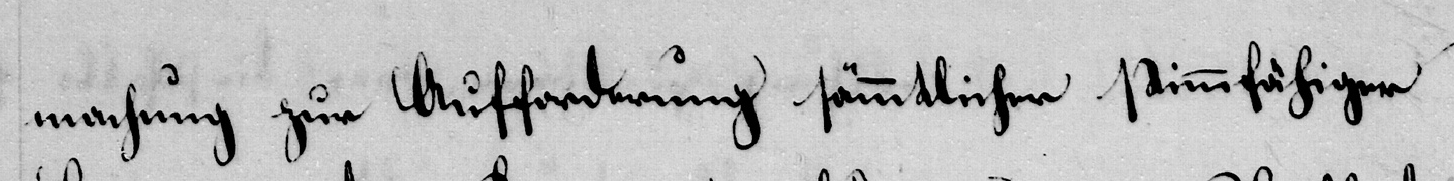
machung zur Aufforderung sämmtlicher stimmfähigen
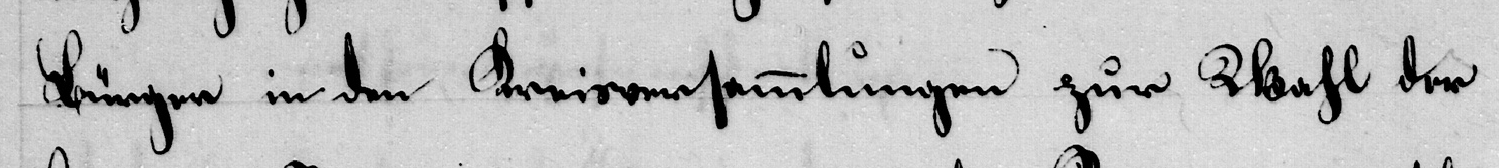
Bürger in den Kreisversammlungen zur Wahl der
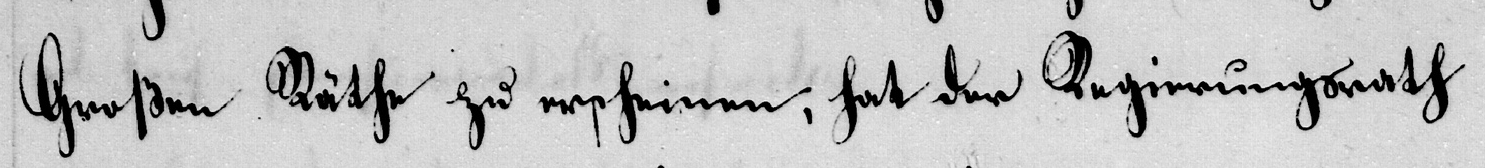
Großen Räthe zu erscheinen, hat der Regierungsrath
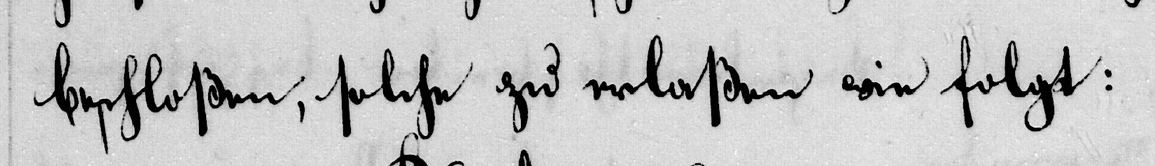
beschloßen, solche zu erlaßen wie folgt:
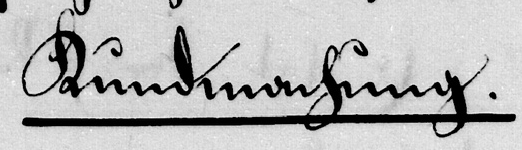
Kundmachung.
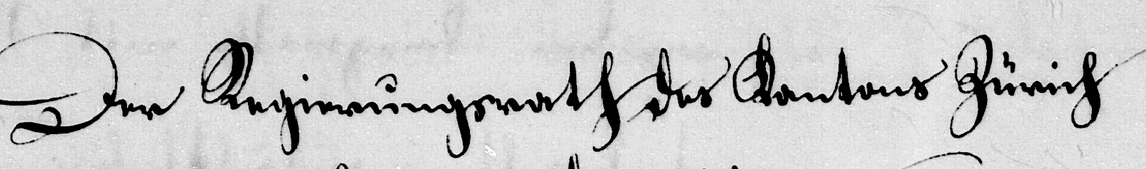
Der Regierungsrath des Kantons Zürich
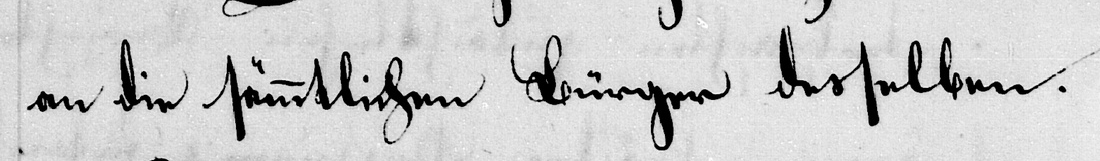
an die sämmtlichen Bürger desselben.
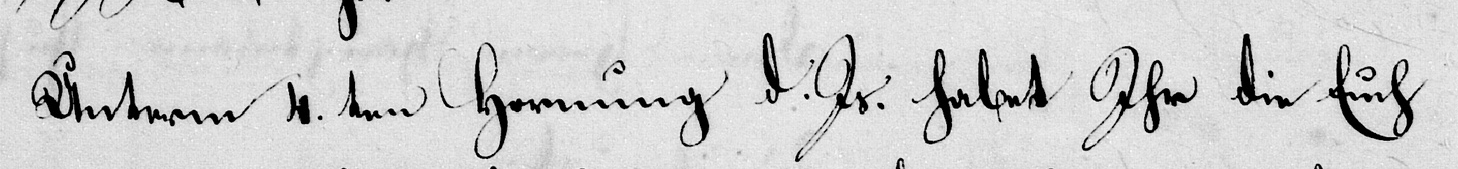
Unterm 4.ten Hornung d. Js. habet Ihr die Euch
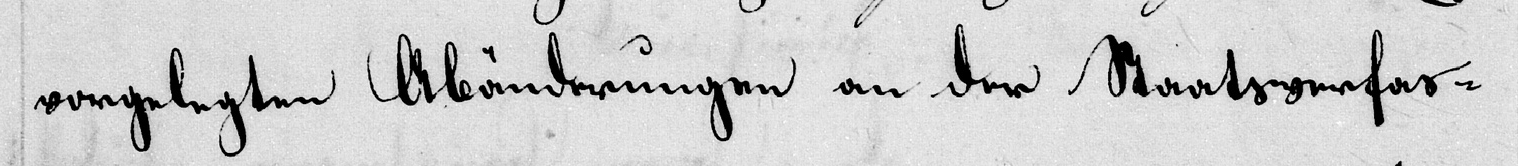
vorgelegten Abänderungen an der Staatsverfaß¬
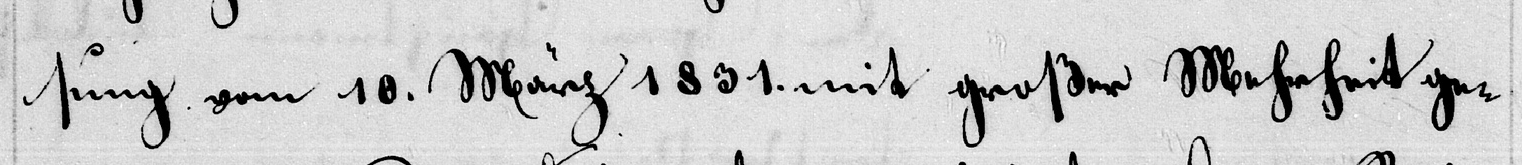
ung vom 10. März 1831. mit großer Mehrheit ge¬
